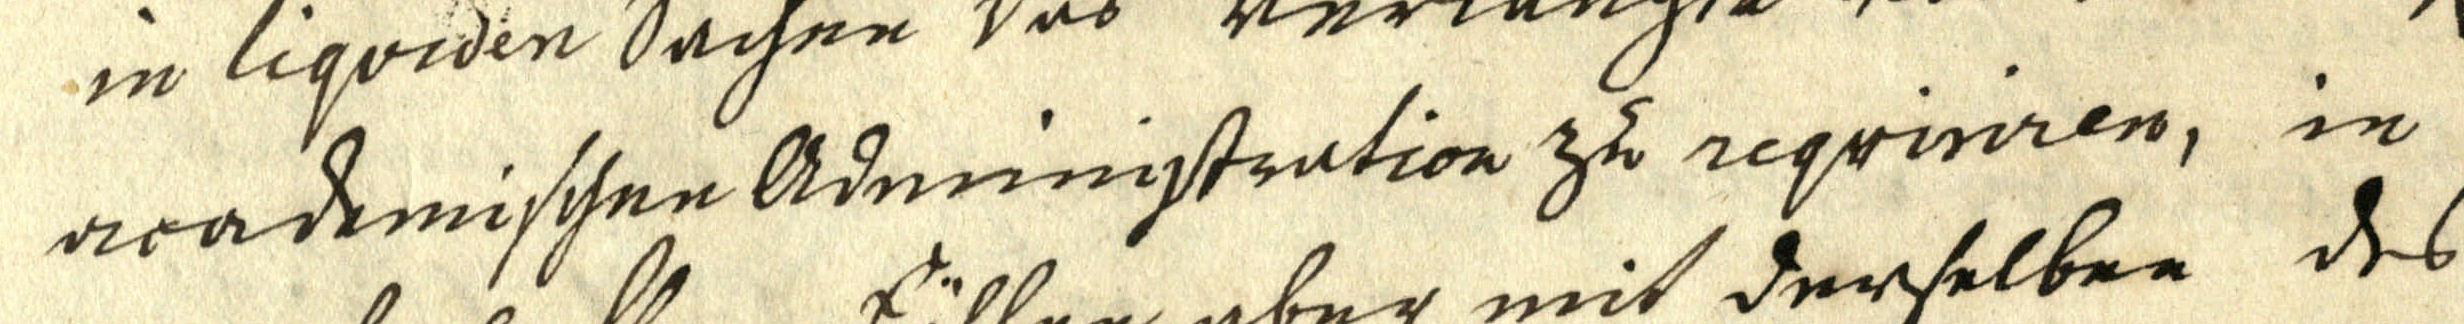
academischen Administration zu requiriren, in
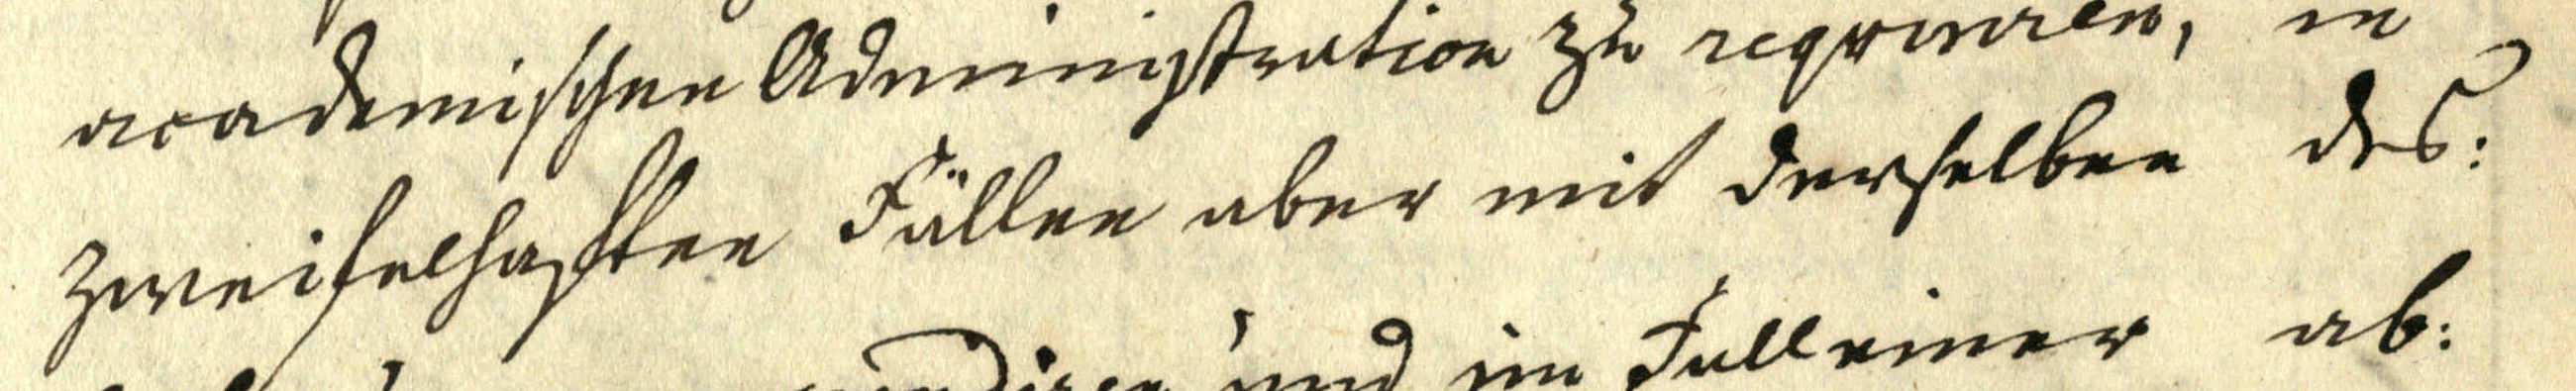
zweifelhaften Fällen aber mit derselben des¬
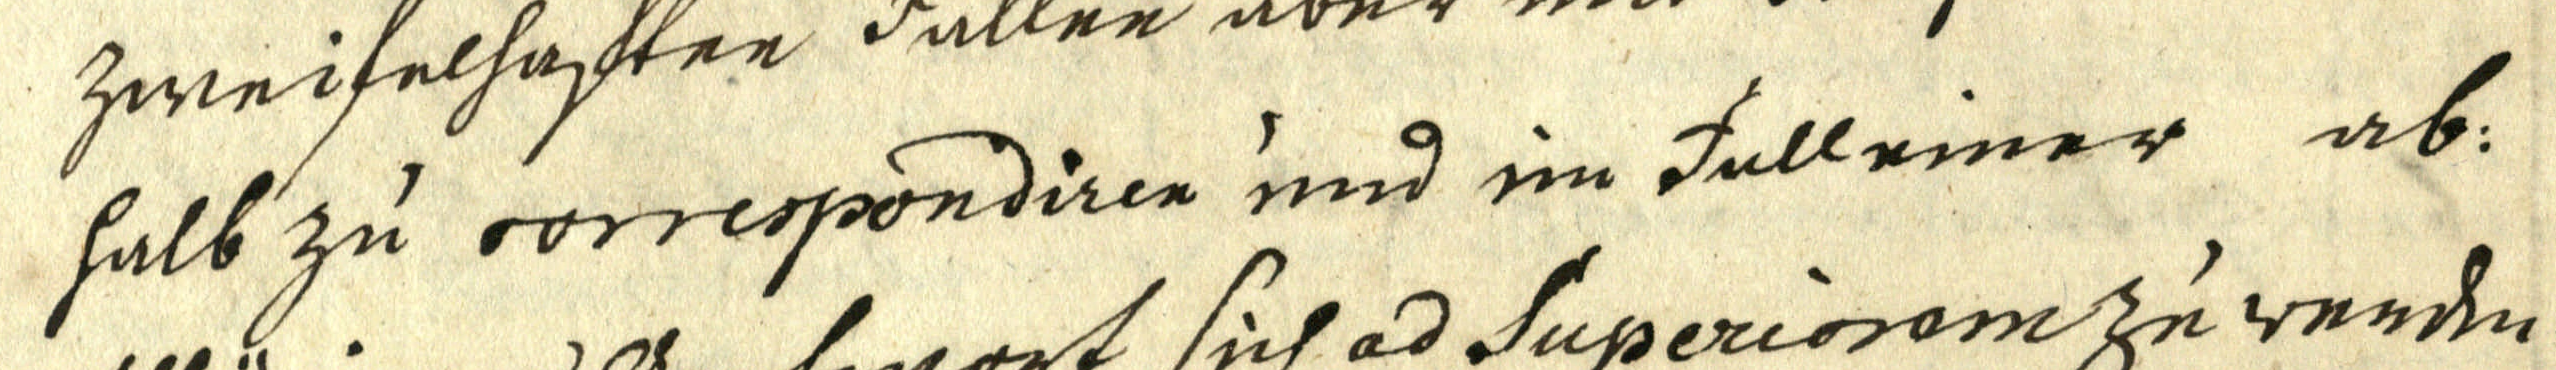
halb zu correspondiren und im Fall einer ab¬
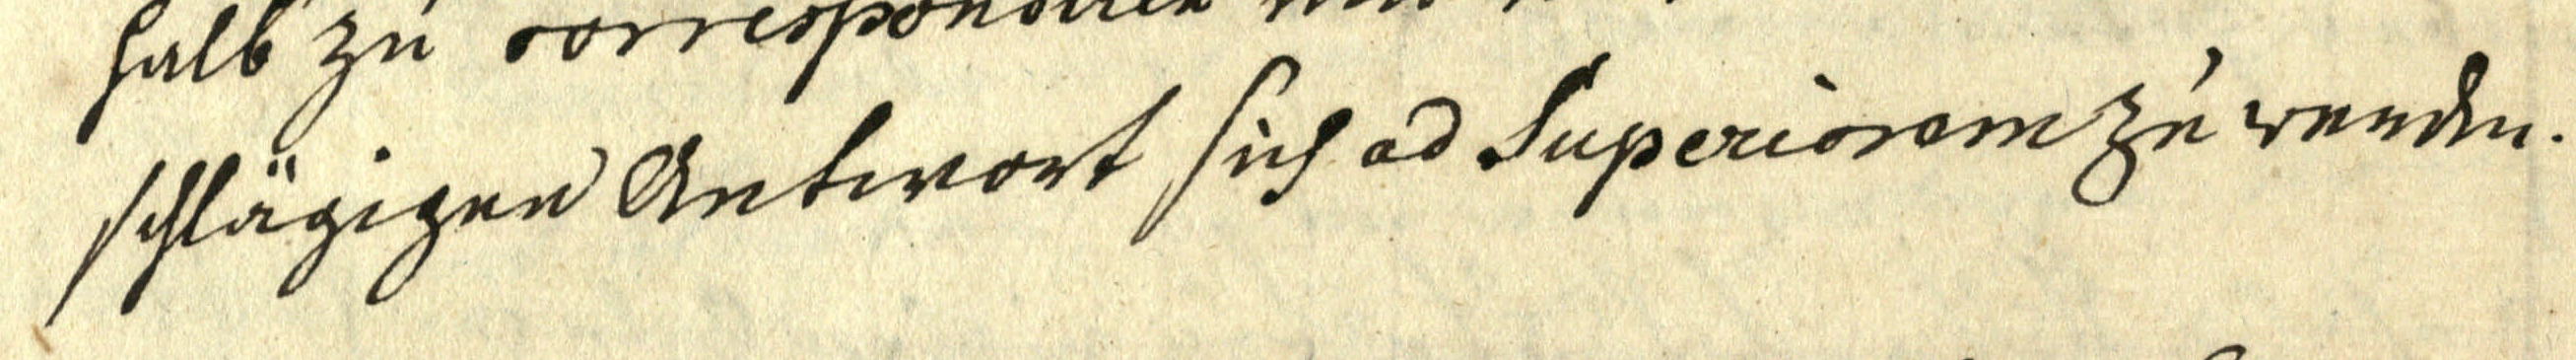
schlägigen Antwort sich ad Superioram zu wenden.
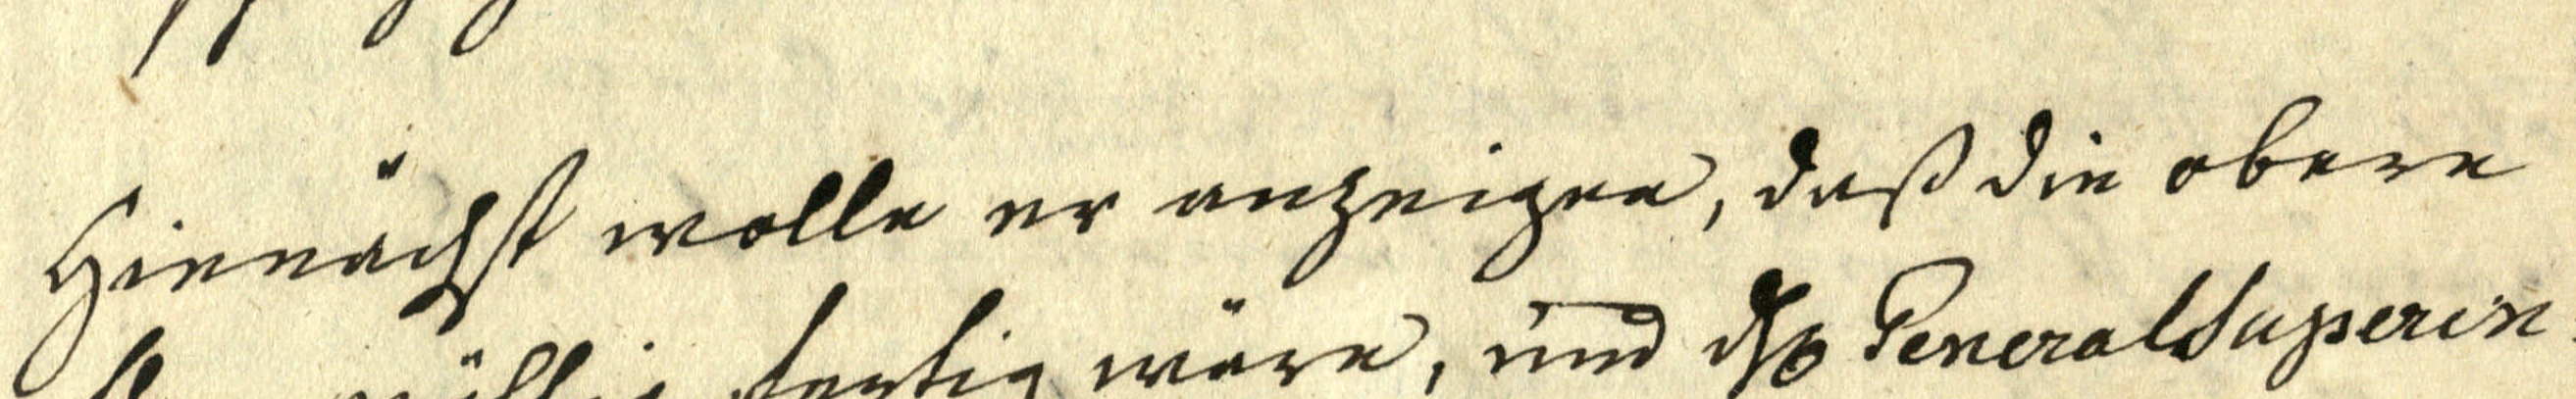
Hienächst wolle er anzeigen, daß die obere
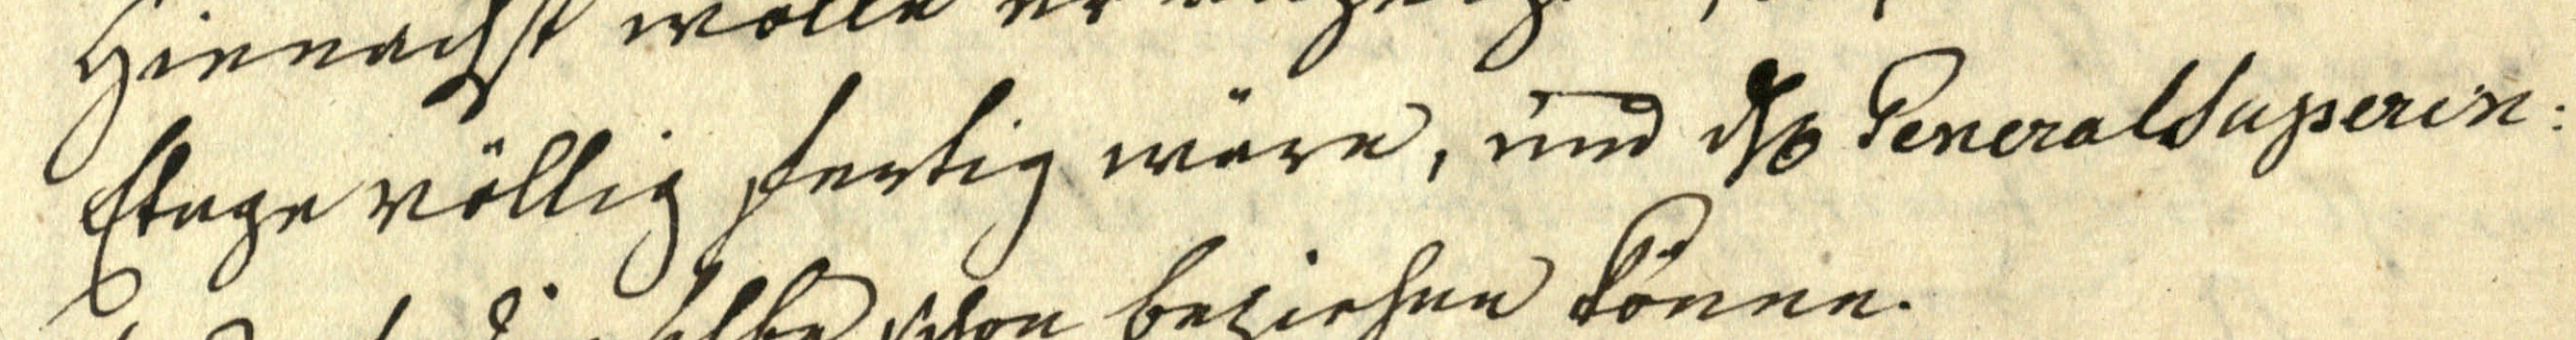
Etage völlig fertig wäre, und dh GeneralSuperin¬
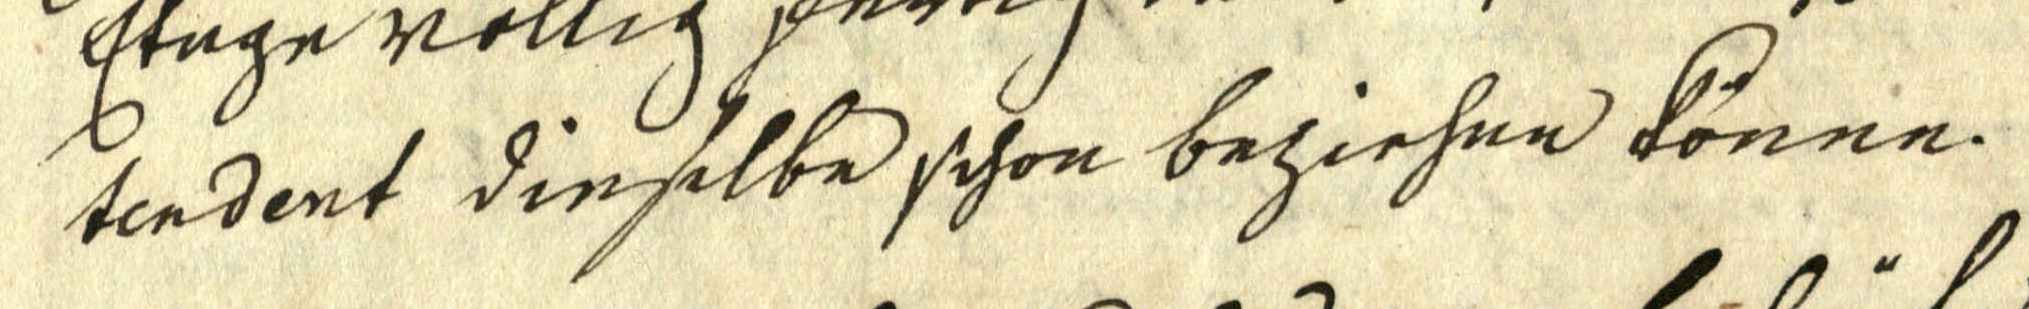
tendent dieselbe schon beziehen könne.
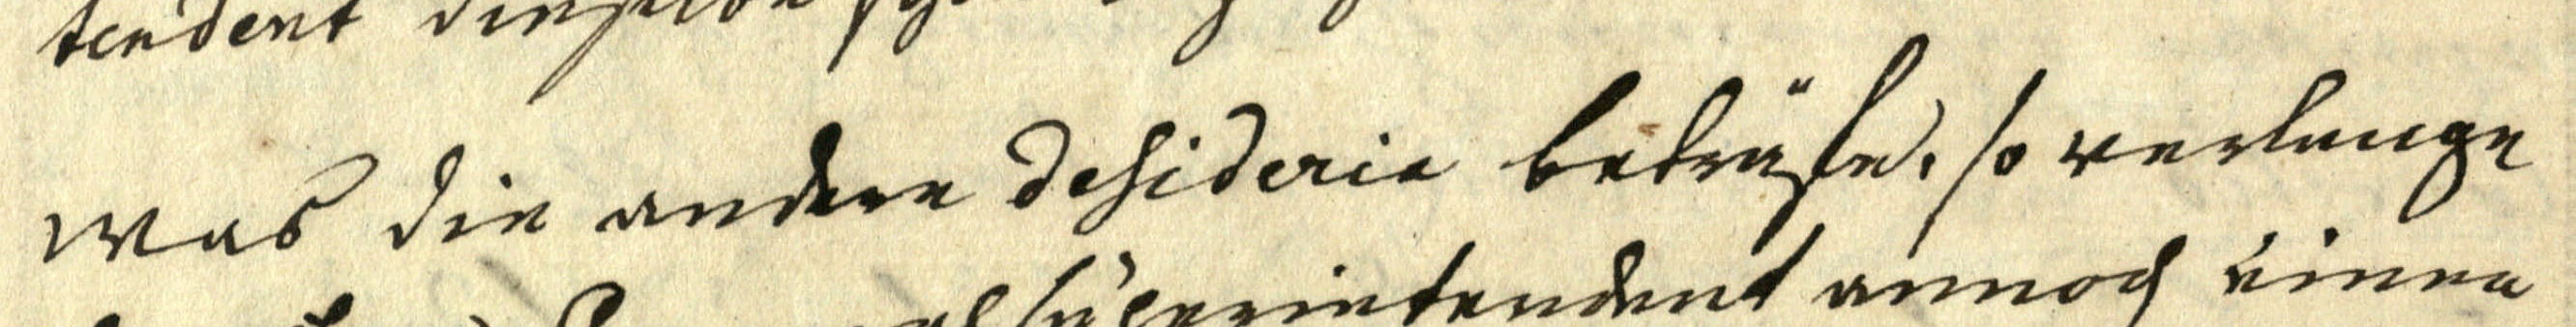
was die andern desideria beträfe, so verlange
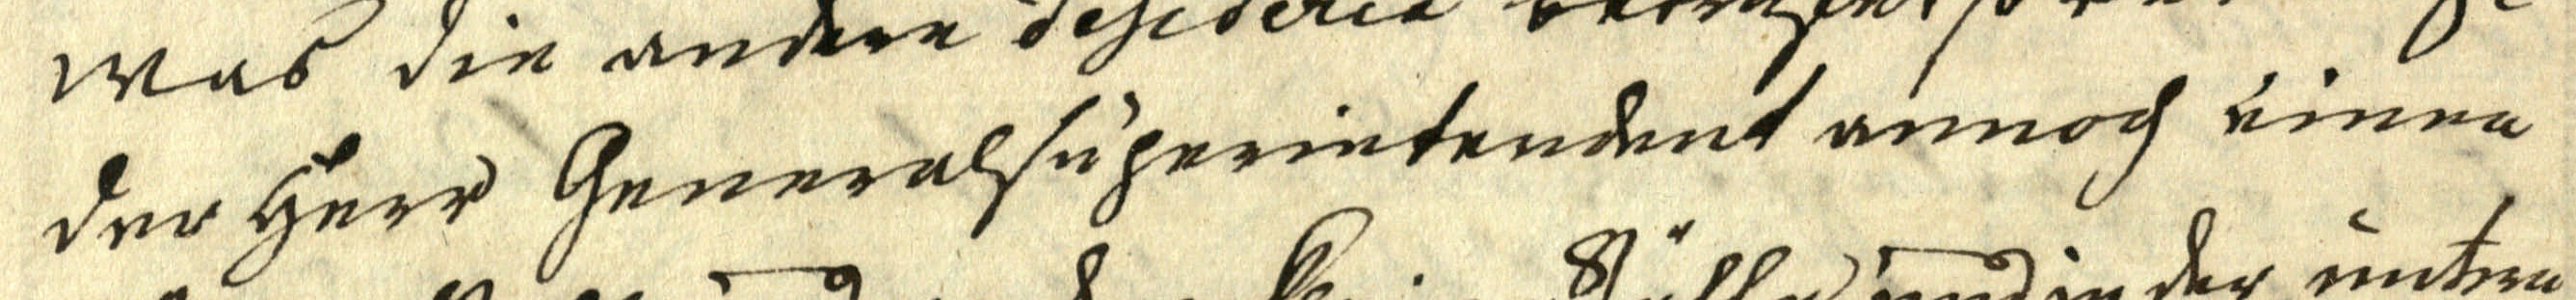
der Herr Generalsuperintendent annoch einen
